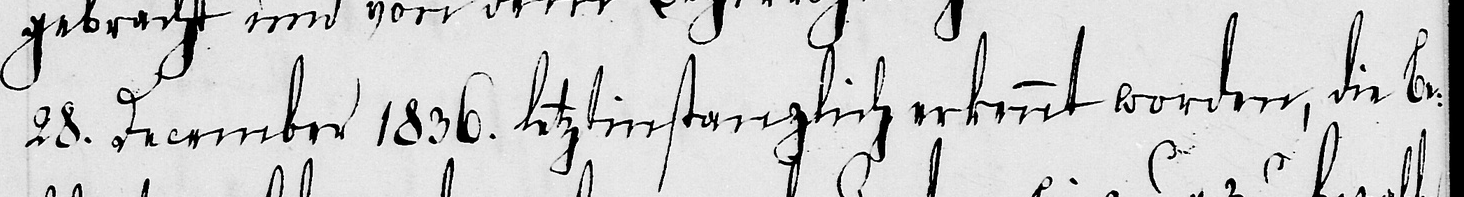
28. December 1836. letztinstanzlich erkannt worden, die B¬
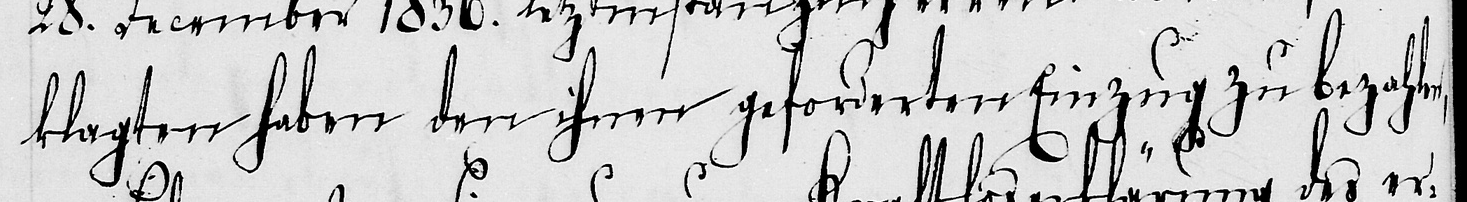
eklagten haben den ihnen geforderten Einzug zu bezahl¬
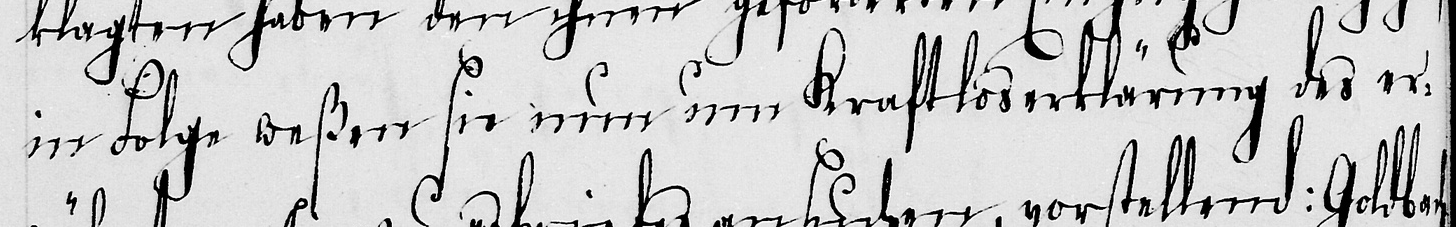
in Folge weßen sie nun um Kraftloserklärung des er¬
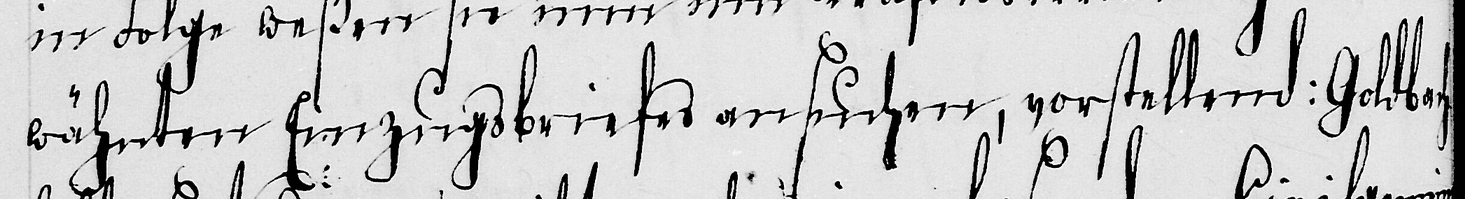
wähnten Einzugsbriefes ansuchen, vorstellend: Goldb¬
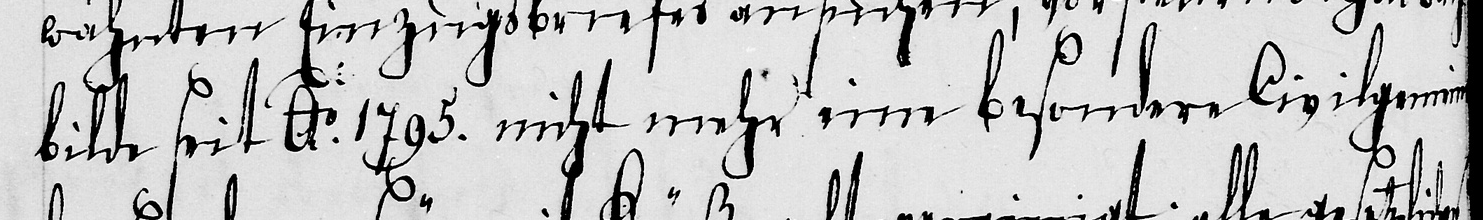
bilde seit A°. 1795. nicht mehr eine besondere Civilgeme¬
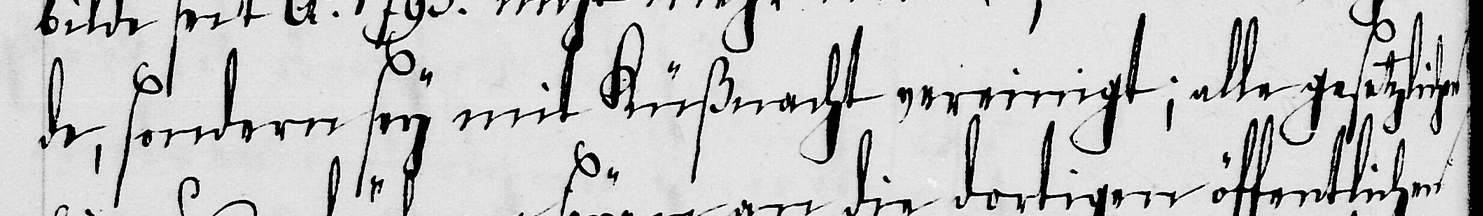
de, sondern sey mit Küßnacht vereinigt; alle geset¬
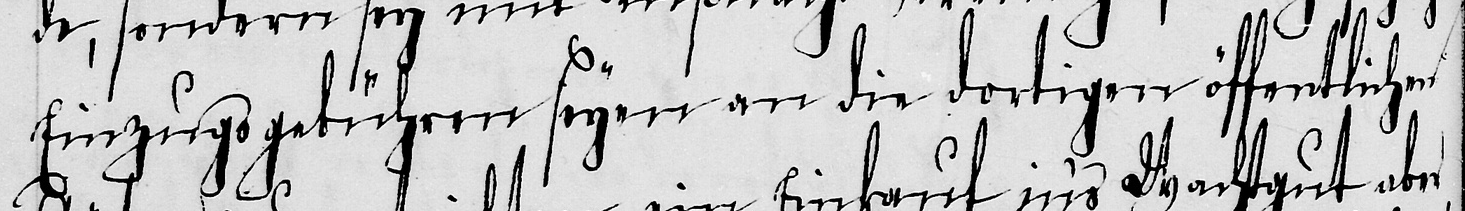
Einzugsgebühren seyen an die dortigen öffentlichen
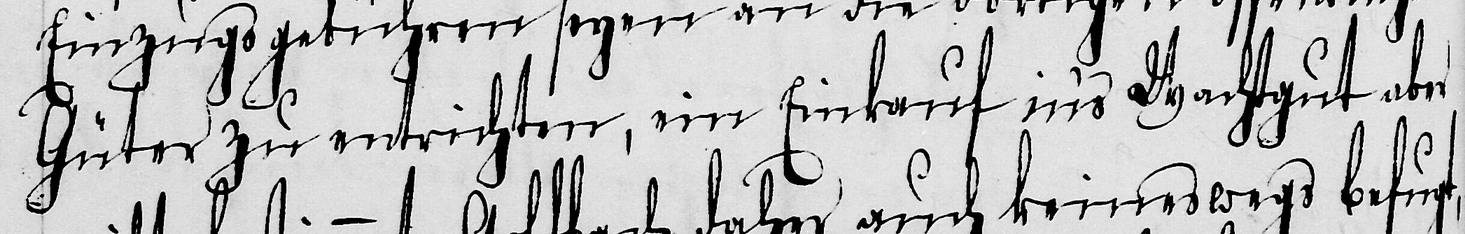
Güter zu entrichten, ein Einkauf ins Wachtgut aber
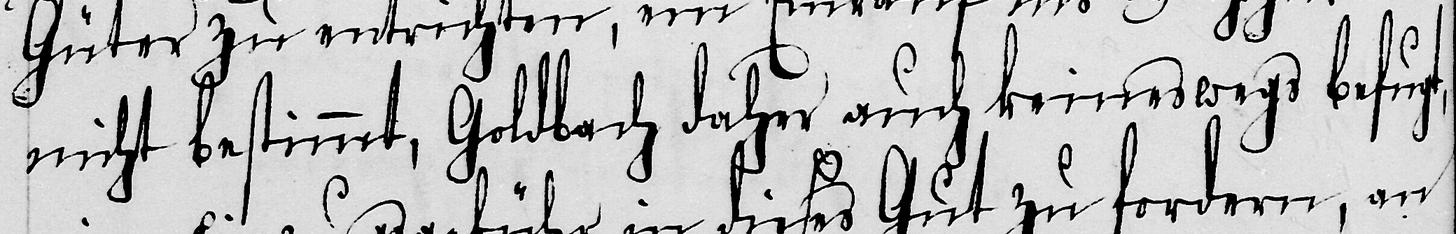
nicht bestimmt, Goldbach daher auch keineswegs befu¬
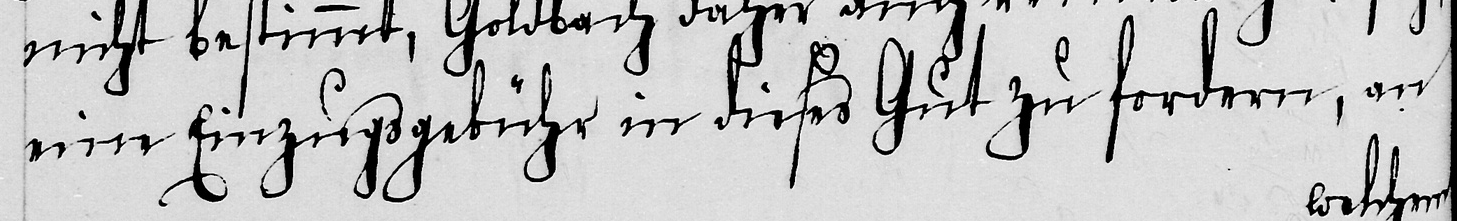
eine Einzugsgebühr in dieses Gut zu fordern, an
